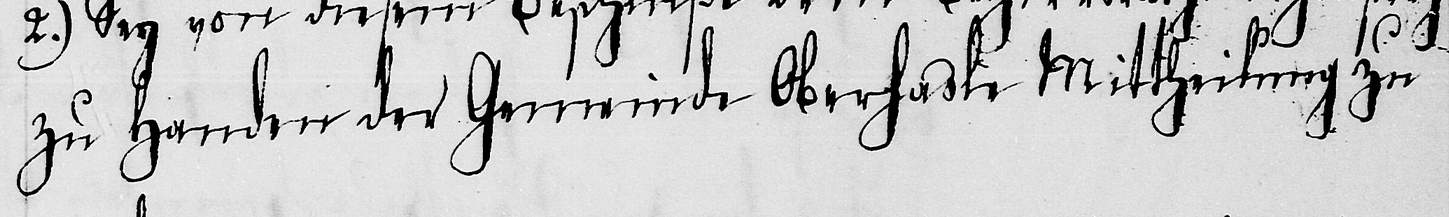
zu Handen der Gemeinde Oberhasle Mittheilung zu
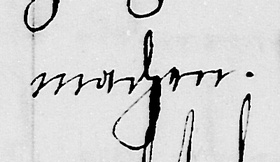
machen.
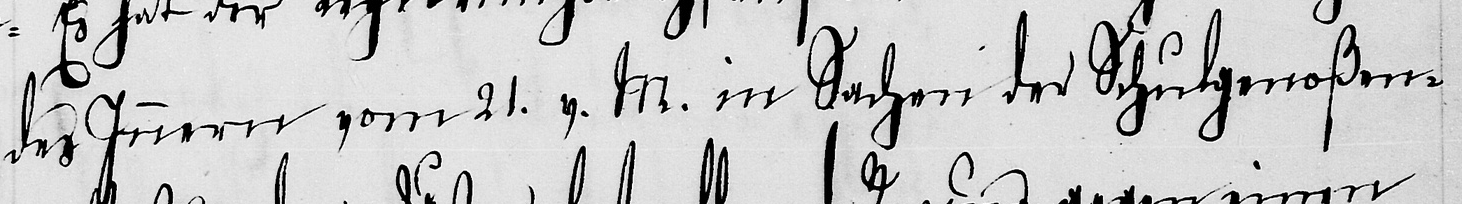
des Innern vom 21. v. M. in Sachen der Schulgenoßen¬
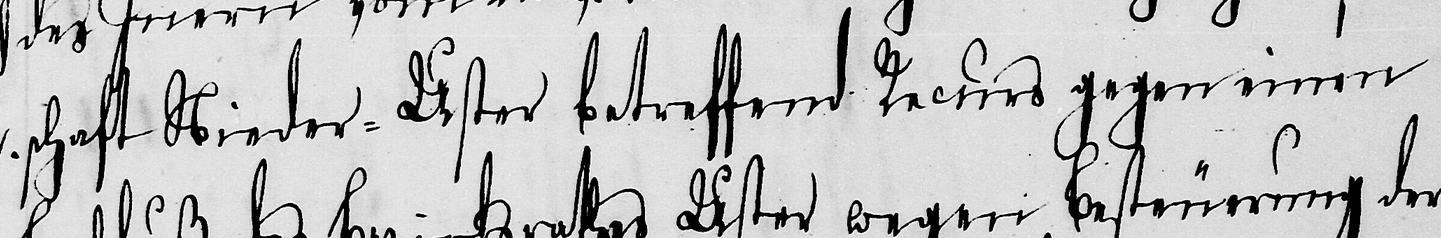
schaft Nieder-Uster betreffend Recurs gegen einen
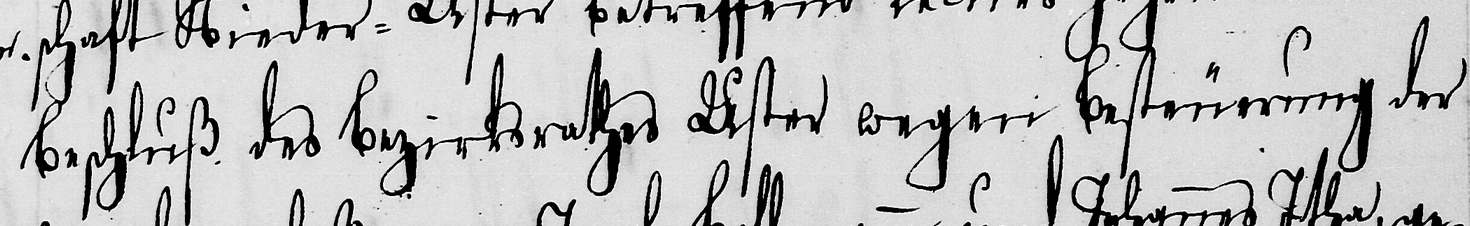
Beschluß des Bezirksrathes Uster wegen Besteuerung der
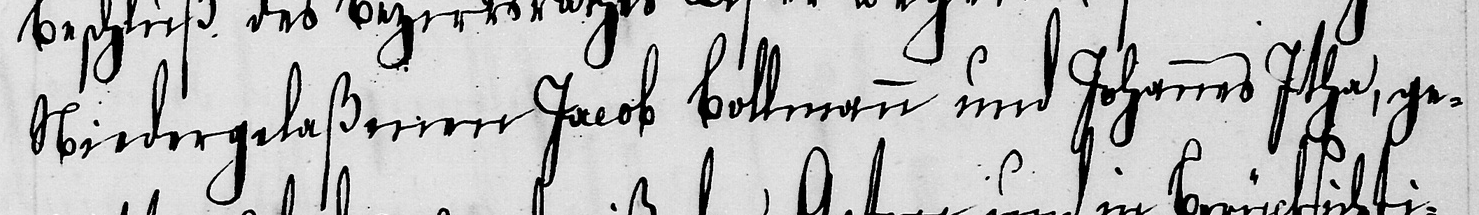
Niedergelaßenen Jacob Bollmann und Johannes Itha, g¬
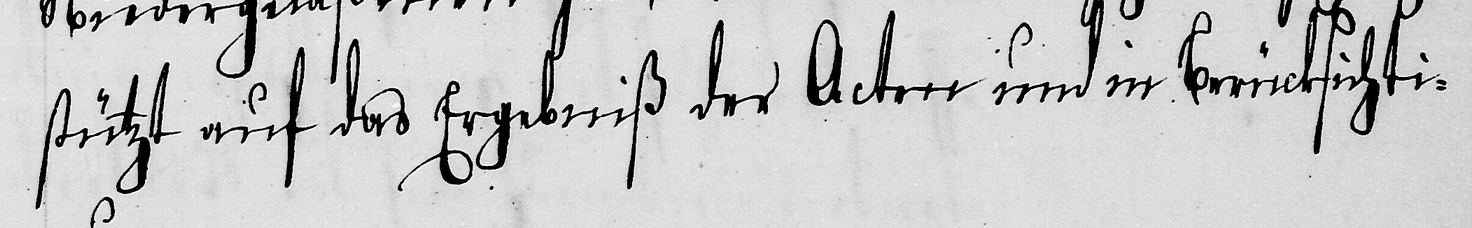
estützt auf das Ergebniß der Acten und in Berücksichti¬
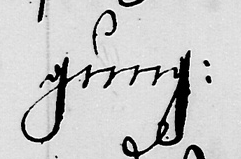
gung:
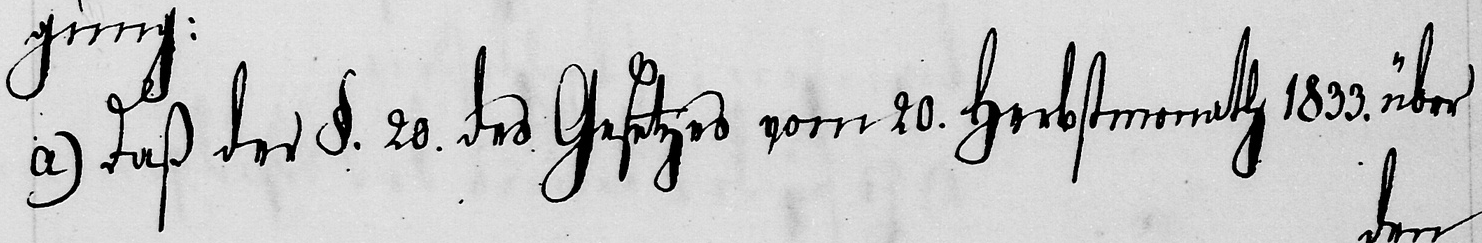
a.) Daß der §. 20. des Gesetzes vom 20. Herbstmonath 1833. über
